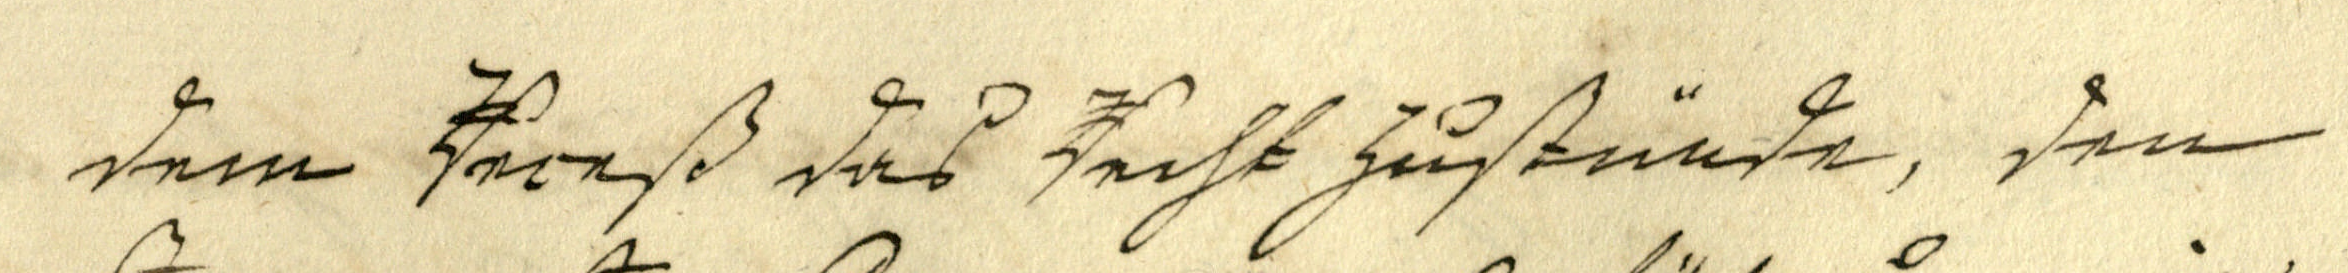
dem Receß das Recht zustünde, den
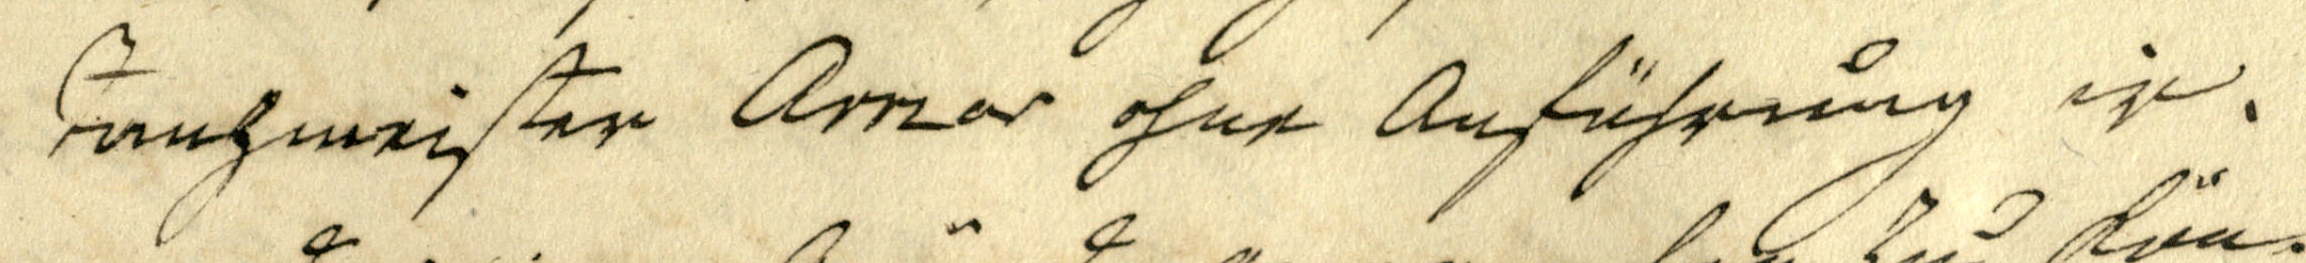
Tanzmeister Amor ohne Anführung ir¬
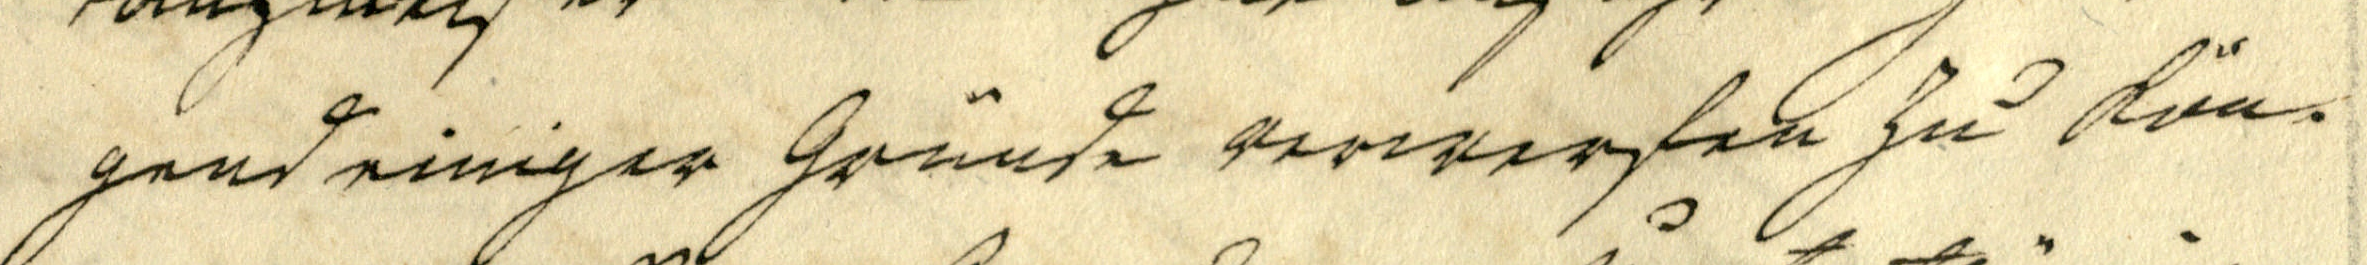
gend einiger Gründe verwerfen zu kön¬
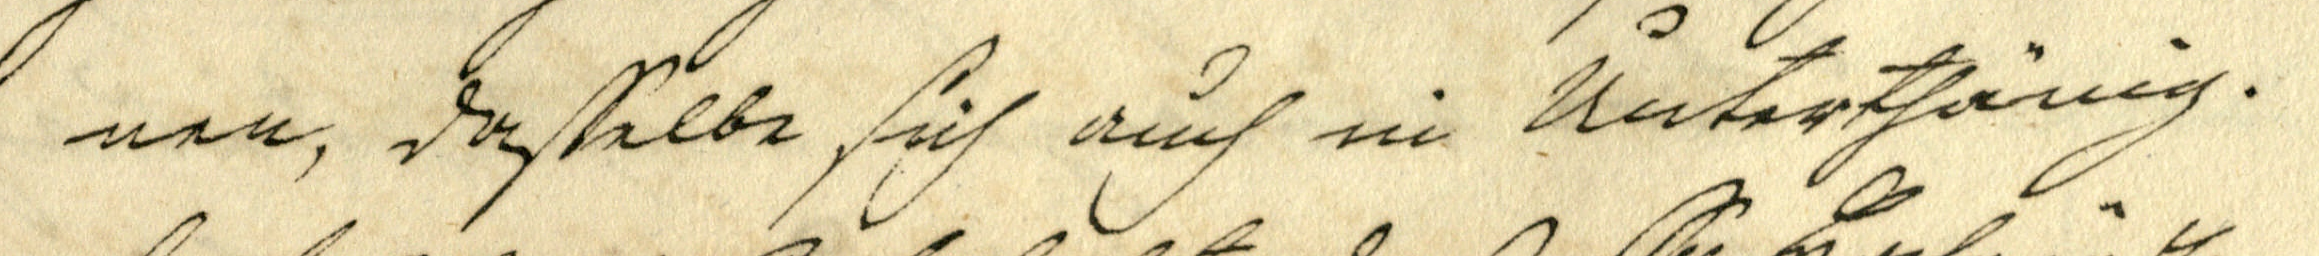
nen, dasselbe sich auch in Unterthänig¬
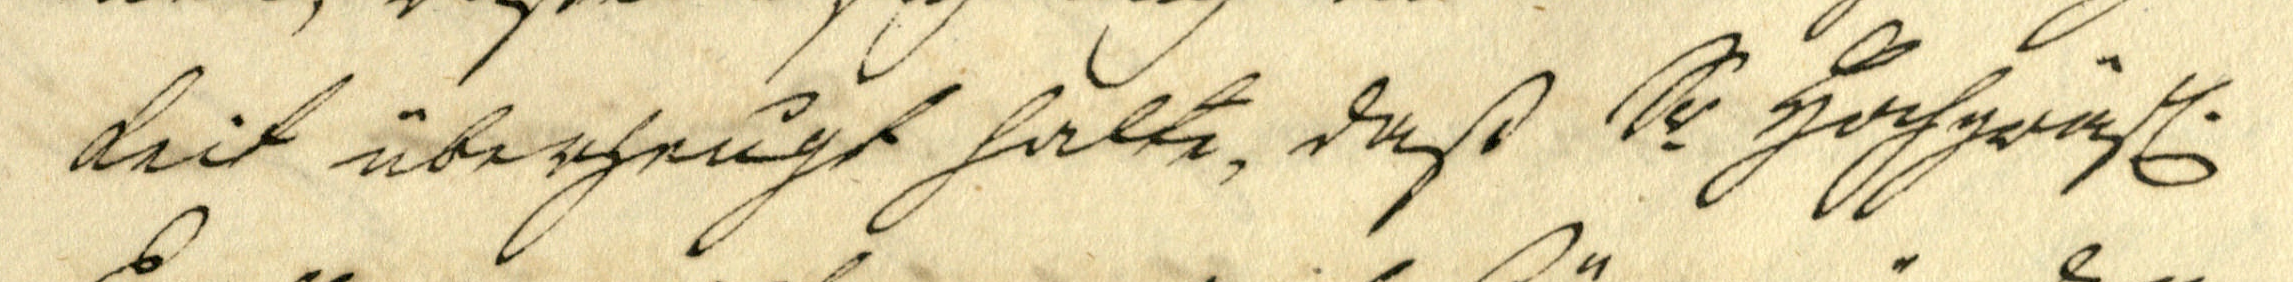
keit überzeugt halte, daß Sr Hochgräfl.
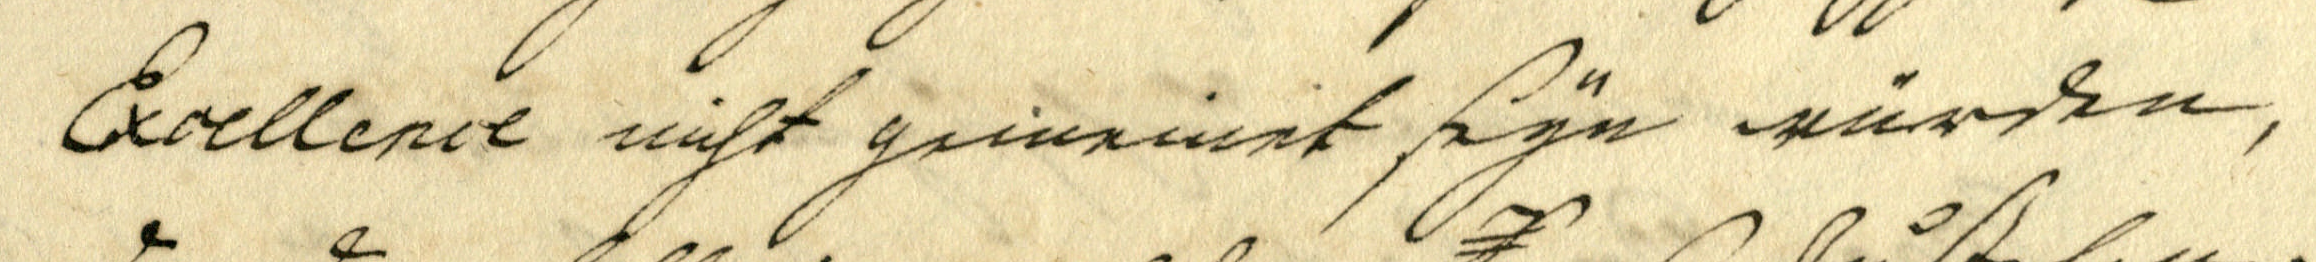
Excellence nicht gemeinet seÿn würden,
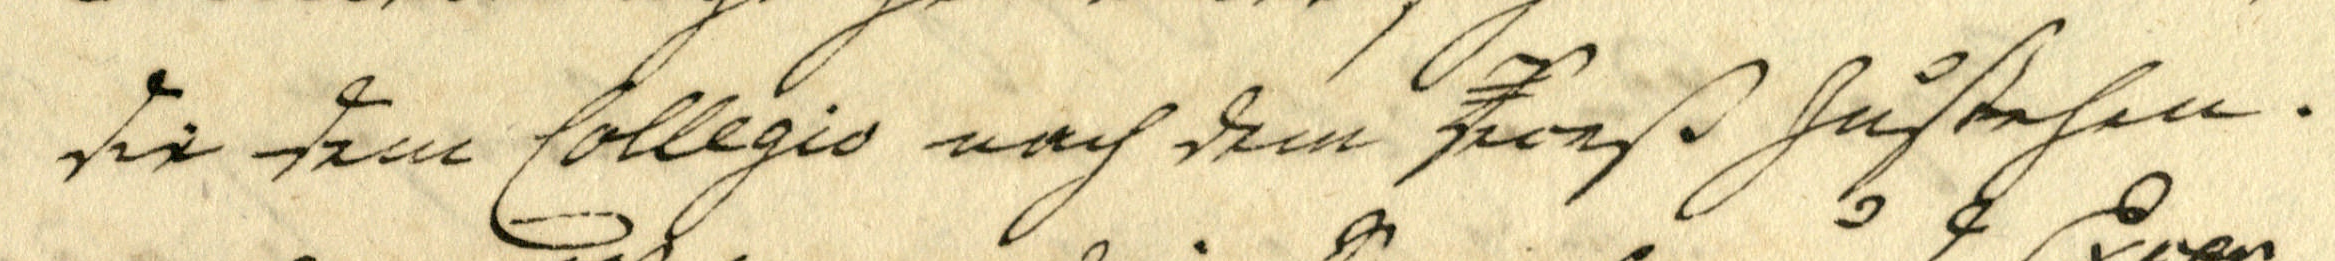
die dem Collegio nach dem Receß zustehen¬
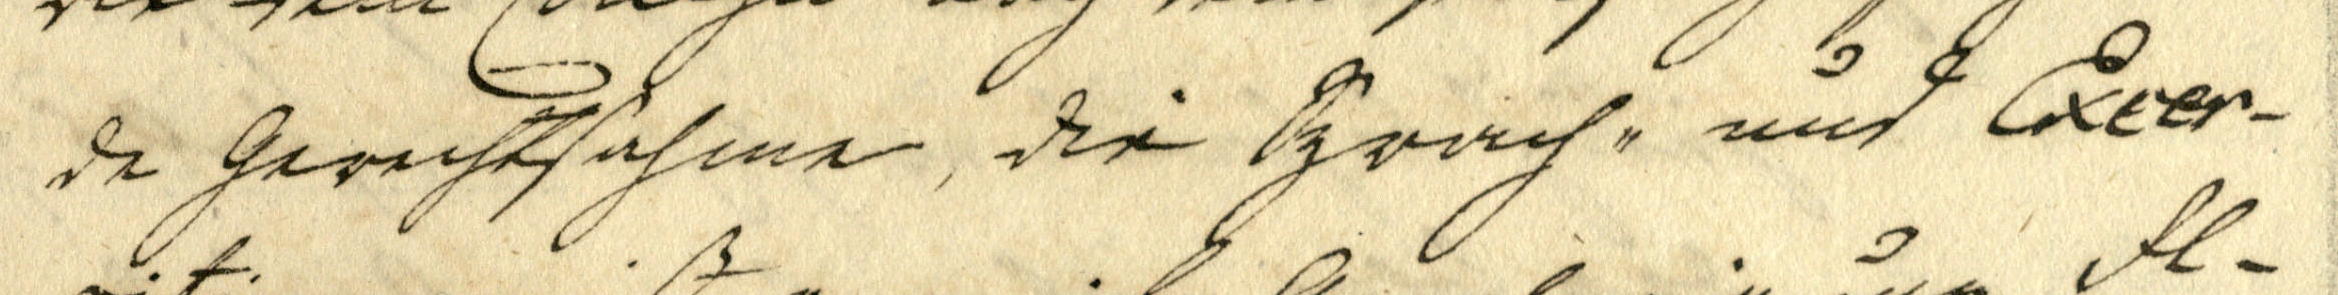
de Gerechtsahme die Sprach- und Excer¬
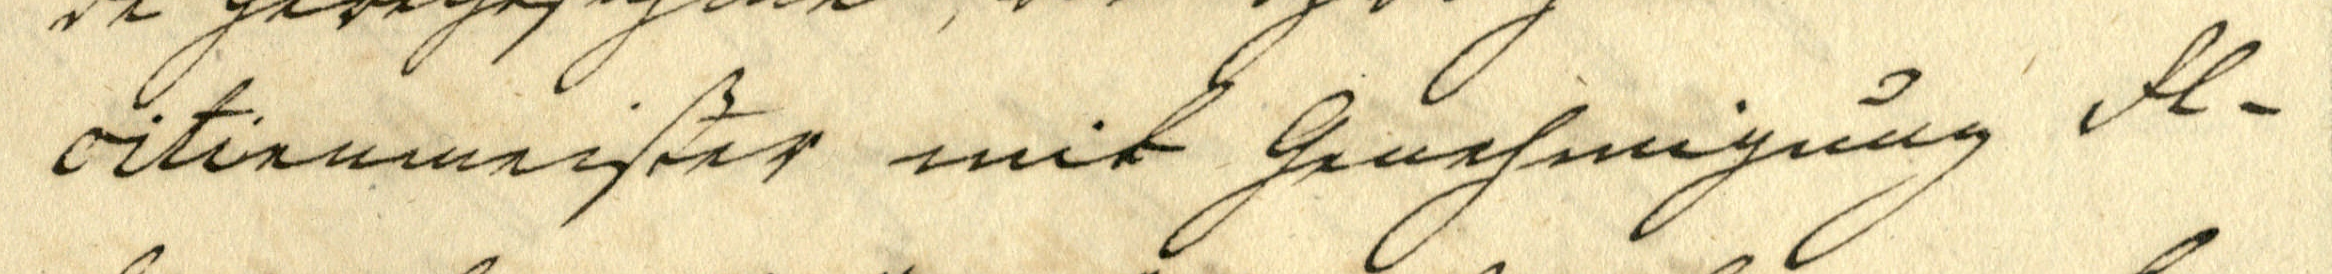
citienmeister mit Genehmigung ll¬
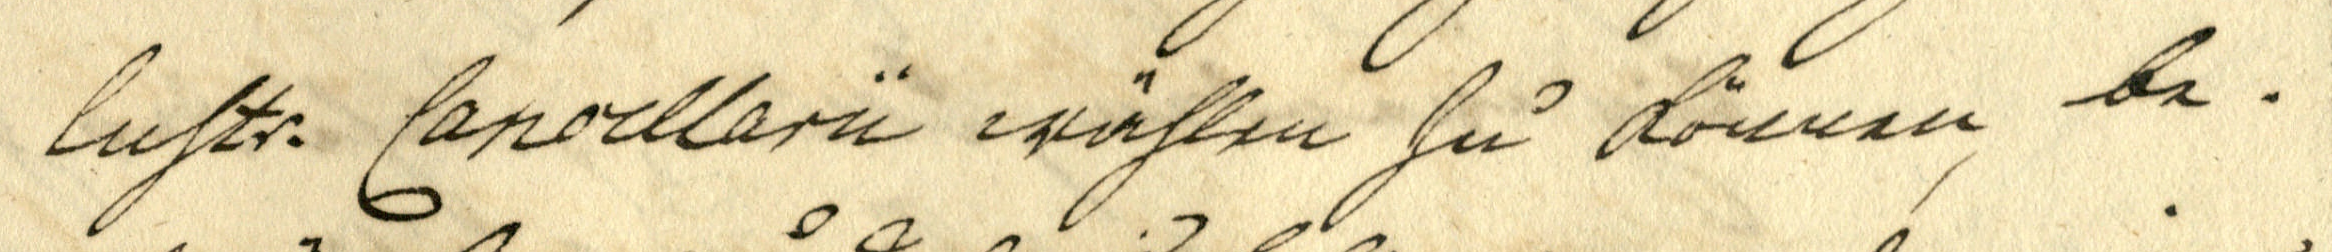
lust. Cancellarii wählen zu können be¬
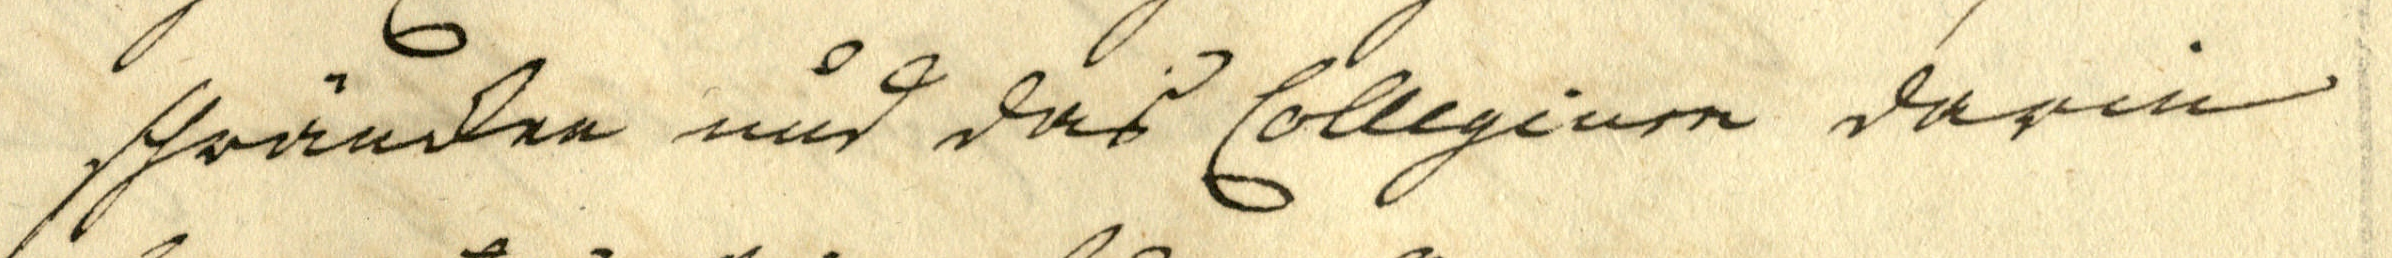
schräncken und das Collegium darin
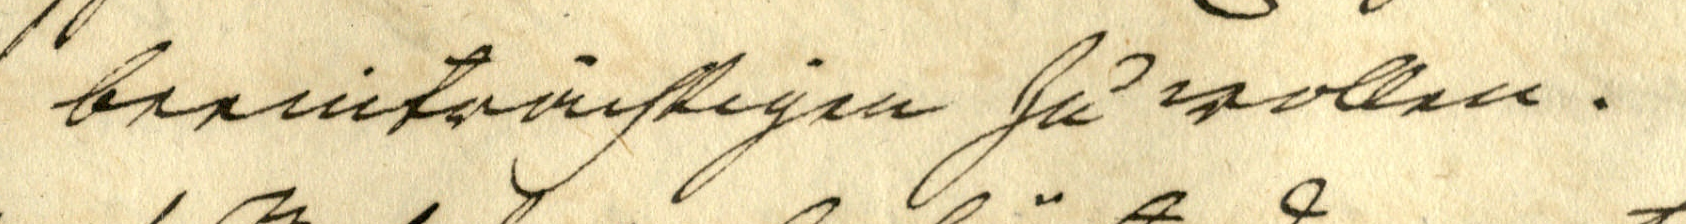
beeinträchtigen zu wollen.
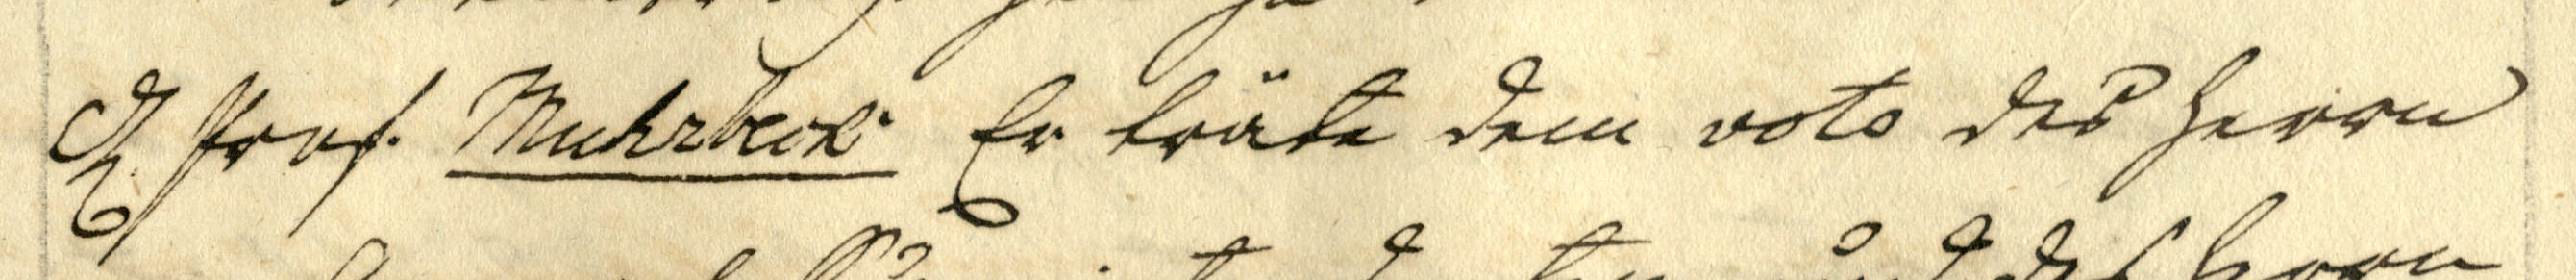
dh. Prof. Muhrbeck. Er träte dem voto des Herrn
